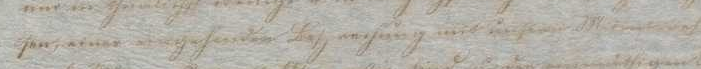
sen, einer eingehenden Besprechung mit unsern Mitintereßenten
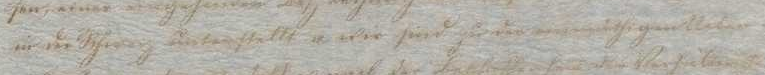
in der Schweiz unterstellt & wir sind zu der einmüthigen Ueber-
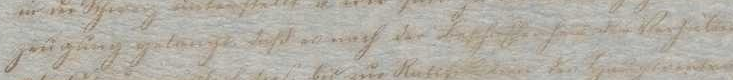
zeugung gelangt, daß es nach der Beschaffenheit der Verhältnisse
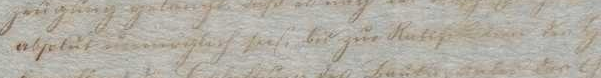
absolut unmöglich sei, bis zur Ratifikation des
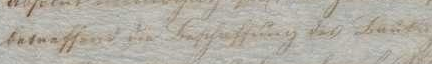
betreffend die Beschaffung des Baukapitales
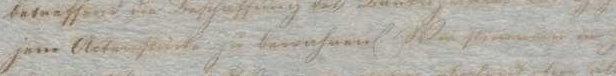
jene Actenstücke zu bewahren. Wir stimmen in Fernern in der
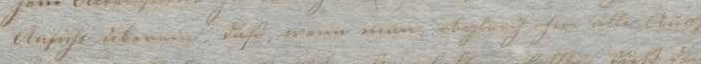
Ansicht überein, daß, wenn man, obgleich ohne alle Aussicht
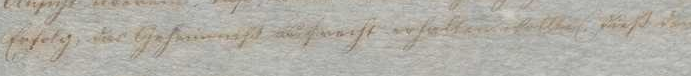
Erfolg, das Geheimniß aufrecht erhalten wollte, dieß den
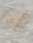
doch
